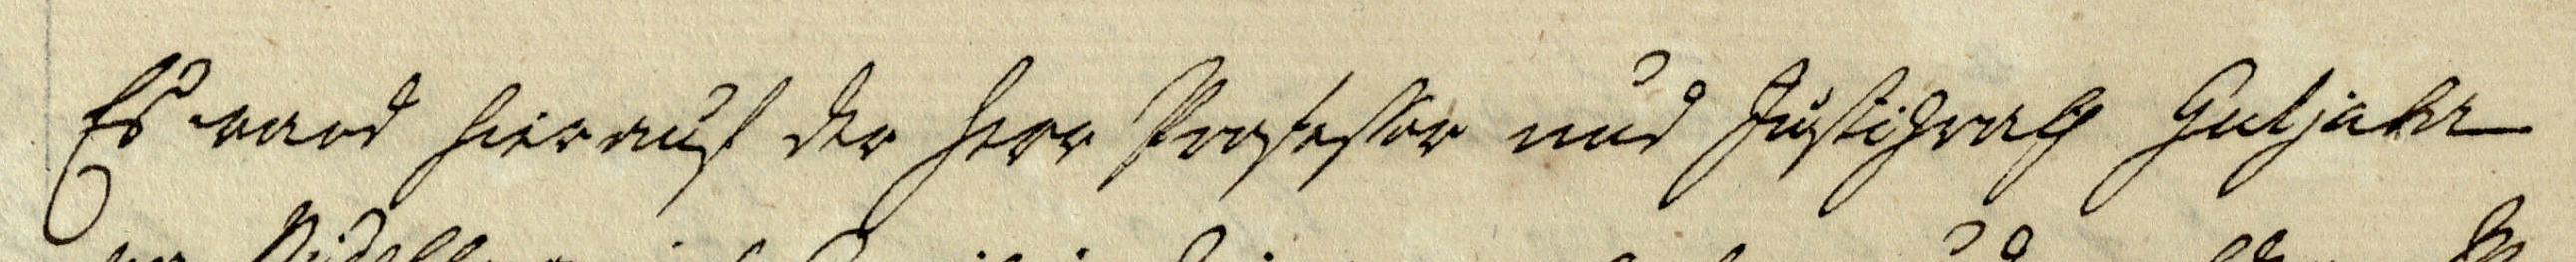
Es ward hierauf der Herr Professor und Justizrath Gutjahr
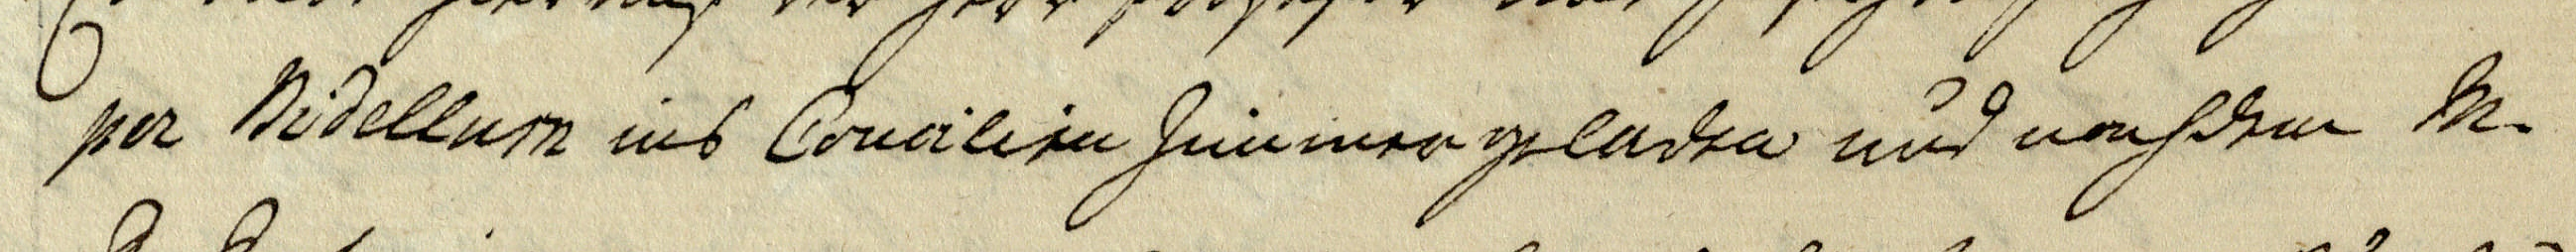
per Bidellum ins Concilien Zimmer geladen und nachdem M.
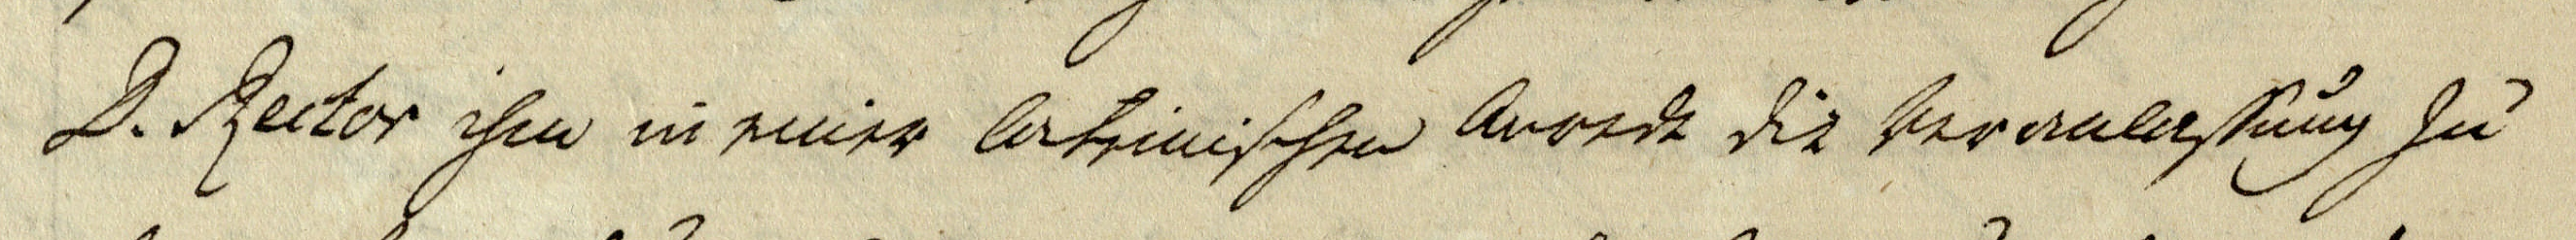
D. Rector ihm in einer lateinischen Anrede die Veranlassung zu
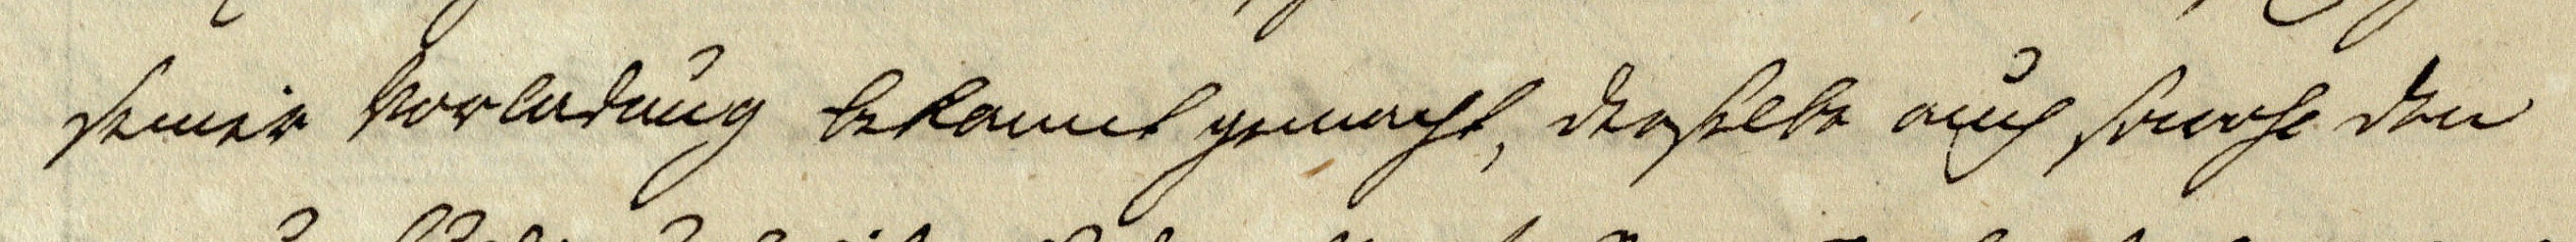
seiner Vorladung bekannt gemacht, derselbe auch sowohl den
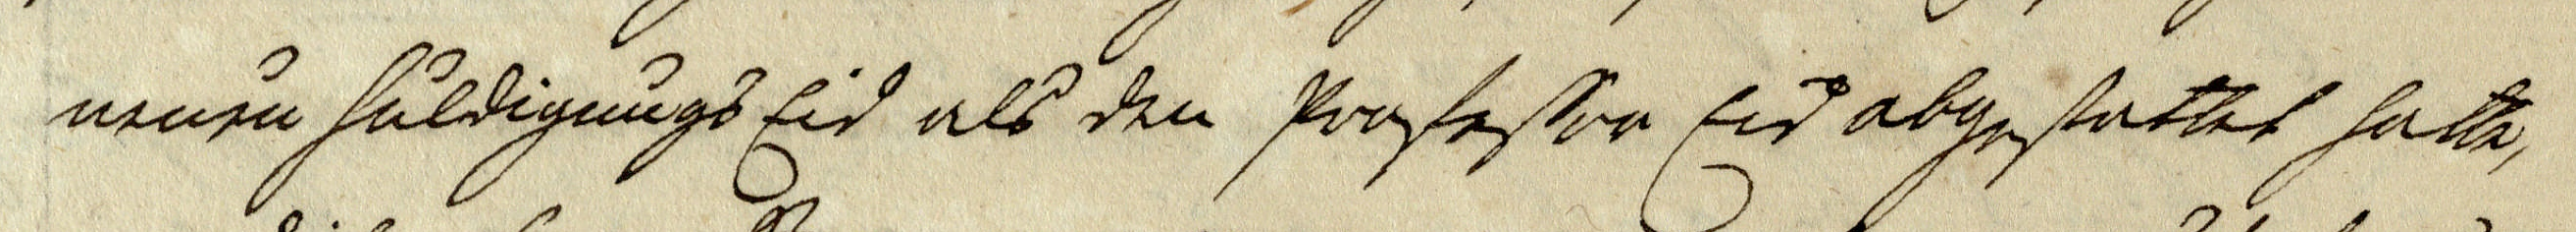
neuen Huldigungs Eid als den Professor Eid abgestattet hatte,
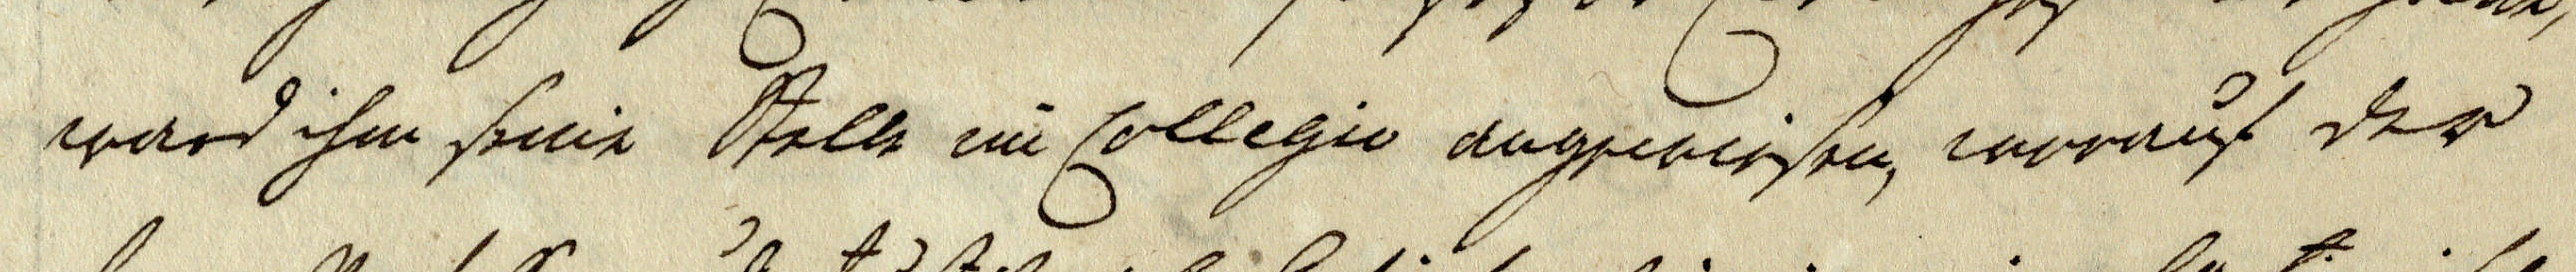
ward ihm seine Stelle im Collegio angewiesen, worauf der
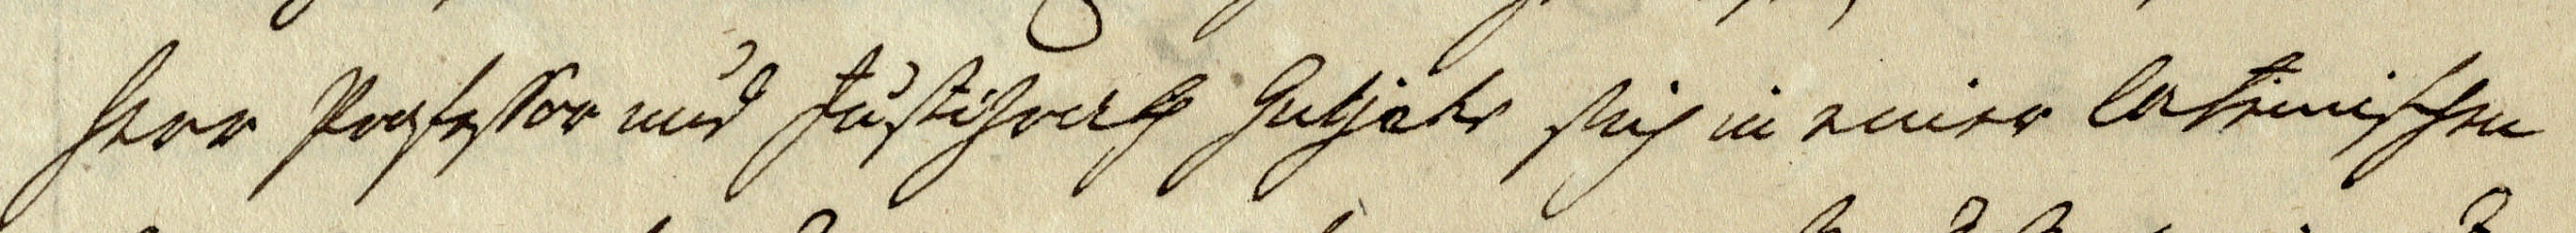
Herr Professor und Justizrath Gutjahr sich in einer lateinischen
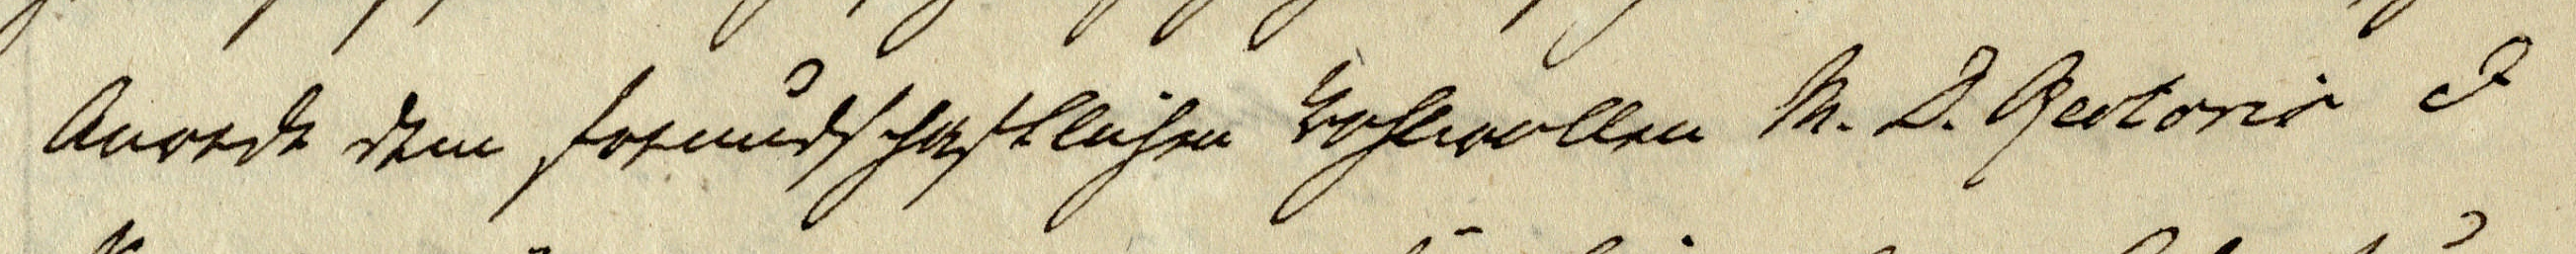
Anrede dem freundschaftlichen Wohlwollen M. D. Rectoris et
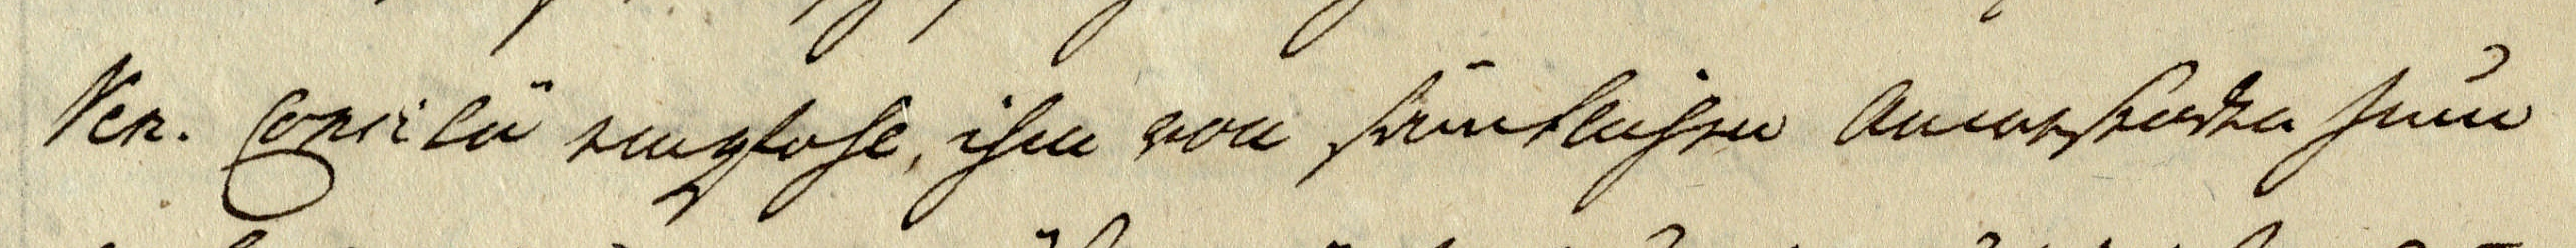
Ven. Concilii empfahl, ihm von sämtlichen Anwesenden zum
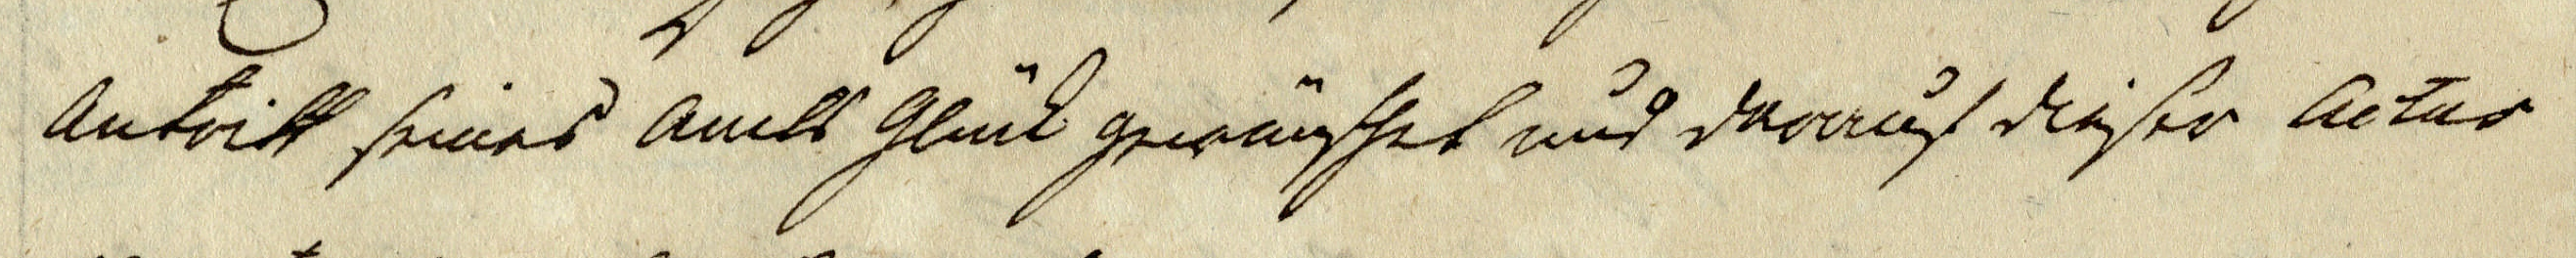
Antritt seines Amts Glück gewünschet und darauf dieser Actus
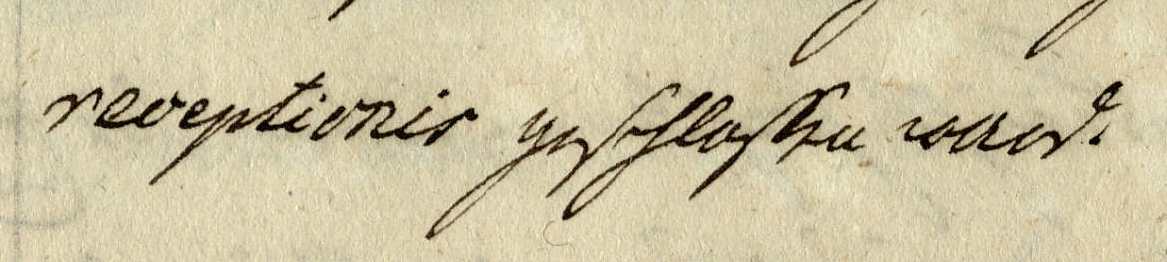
receptionis geschlossen ward.
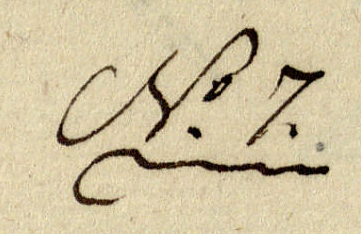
No 7.
